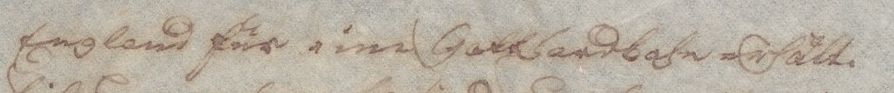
England für eine Gotthardbahn erhält-
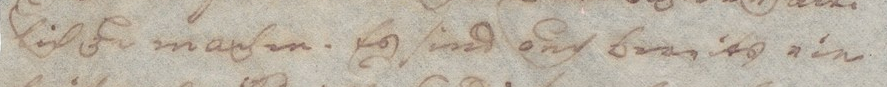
lich zu machen. Es sind auch bereits ein-
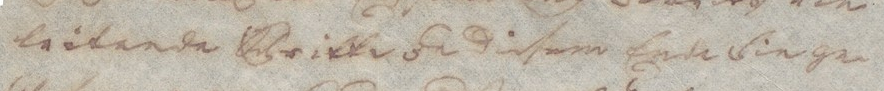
leitende Schritte zu diesem Ende hin ge-
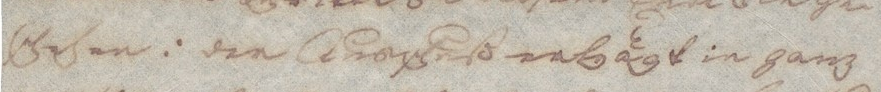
schehen: der Ausschuß erwägt in ganz
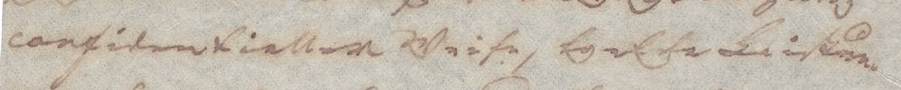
confidentieller Weise, welche Leistun-
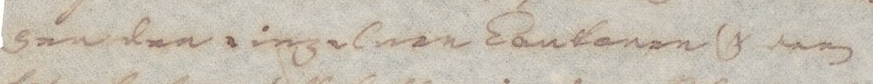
gen den einzelnen Cantonen & den
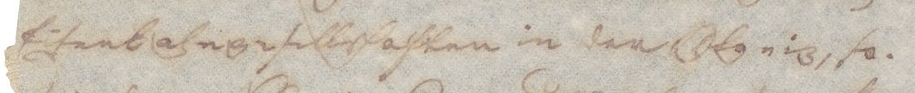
Eisenbahngesellschaften in der Schweiz, so-
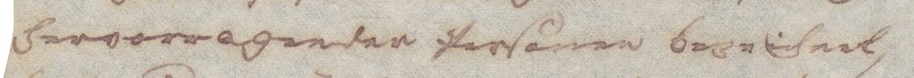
hervorragender Personen bezeichnet,
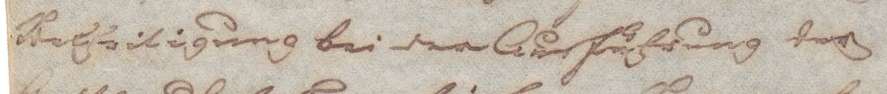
Betheiligung bei der Ausführung der
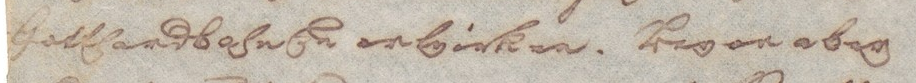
Gotthardbahn zu erwirken. Bevor aber
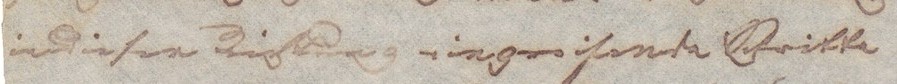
in dieser Richtung eingreifende Schritte
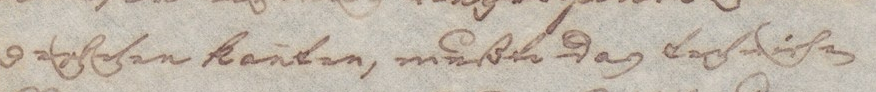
geschehen konnten, mußte das technische
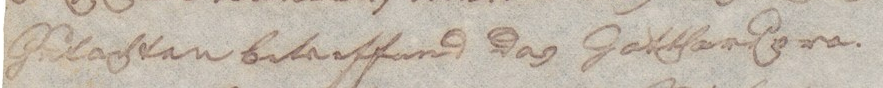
Gutachten betreffend des Gotthardpro-
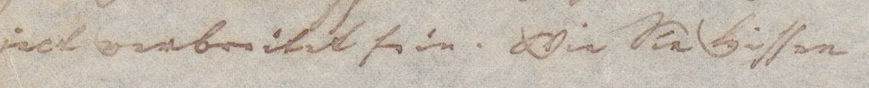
ject verbreitet sein. Wie Sie wissen
